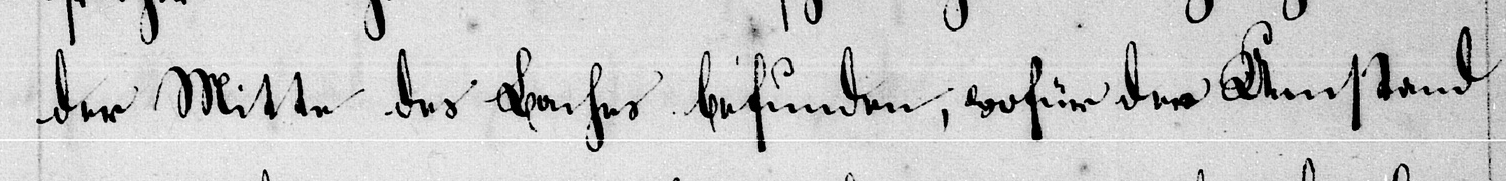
der Mitte des Baches befunden, wofür der Umstand
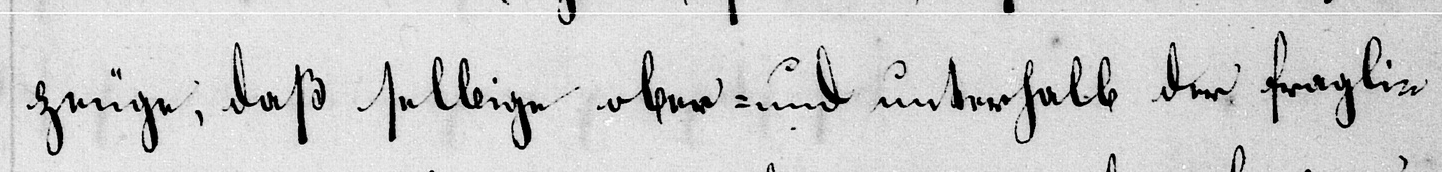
zeuge, daß selbige ober- und unterhalb der fragli¬
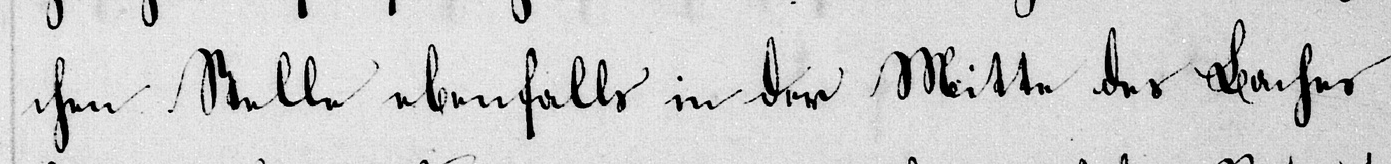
chen Stelle ebenfalls in der Mitte des Baches
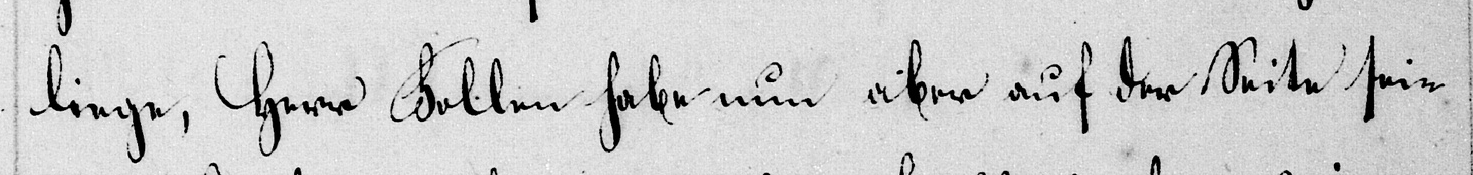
liege, Herr Follen habe nun aber auf der Seite sei¬
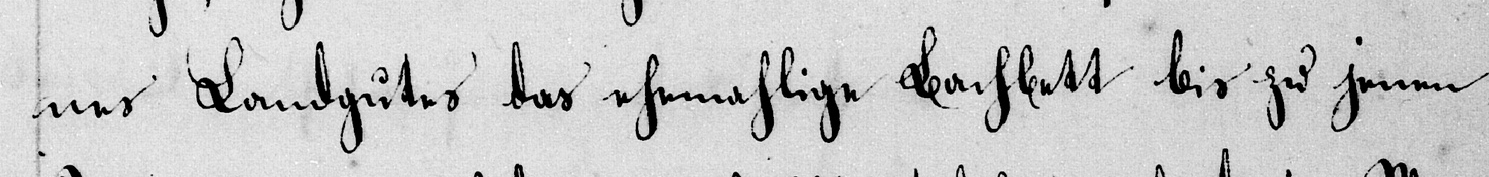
nes Landgutes das ehemahlige Bachbett bis zu jenen
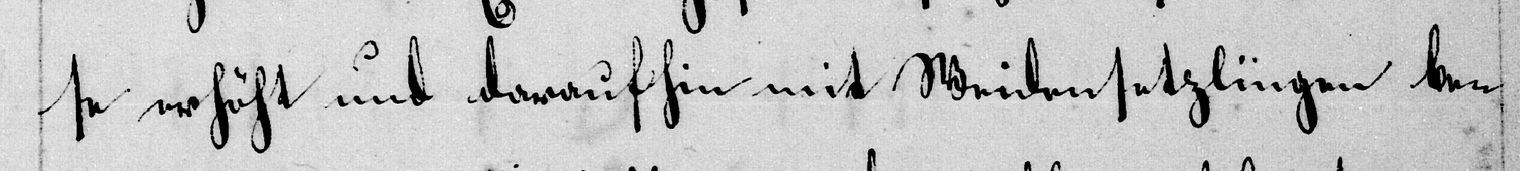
se erhöht und daraufhin mit Weidensetzlingen be¬
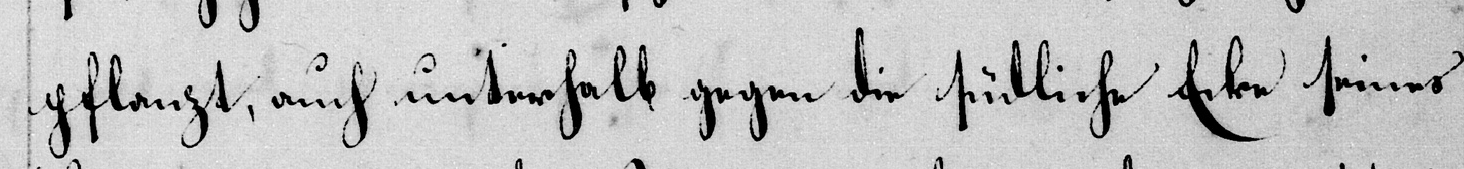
pflanzt, auch unterhalb gegen die südliche Ecke seines
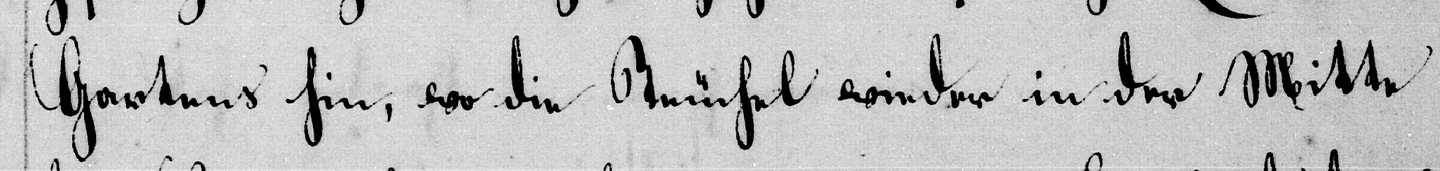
Gartens hin, wo die Teuchel wieder in der Mitte
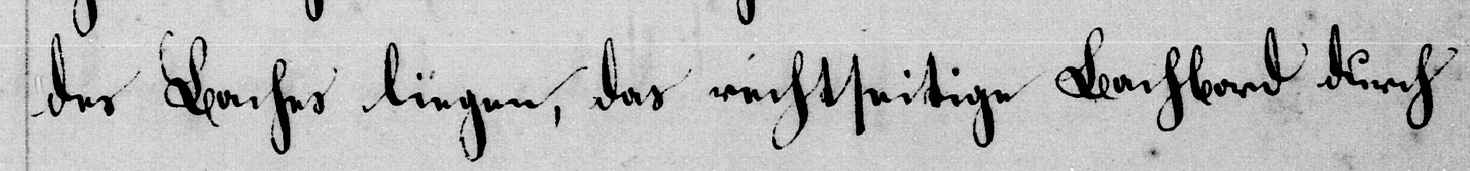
des Baches liegen, das rechtseitige Bachbord durch
